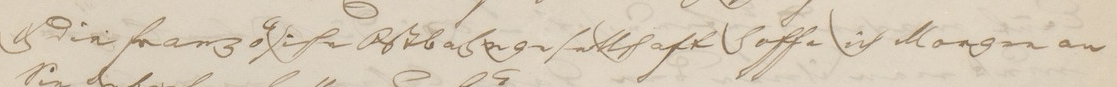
& die französische Ostbahngesellschaft hoffe ich Morgen an
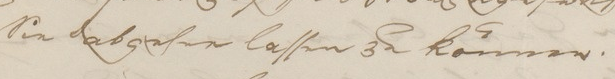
Sie abgehen lassen zu können.
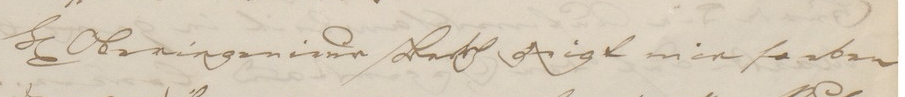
Hr Oberingenieur Beckh zeigt mir soeben
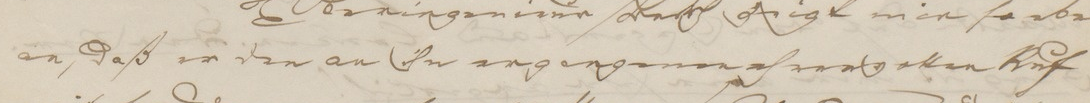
an, daß er den an ihn ergangenen ehrenvollen Ruf
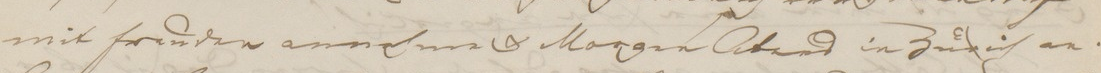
mit Freuden annehme & Morgen Abend in Zürich an-
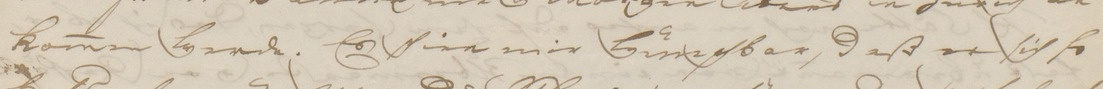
kommen werde. Es schien mir wünschbar, daß er sich
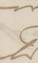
so
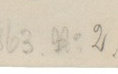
sofort
